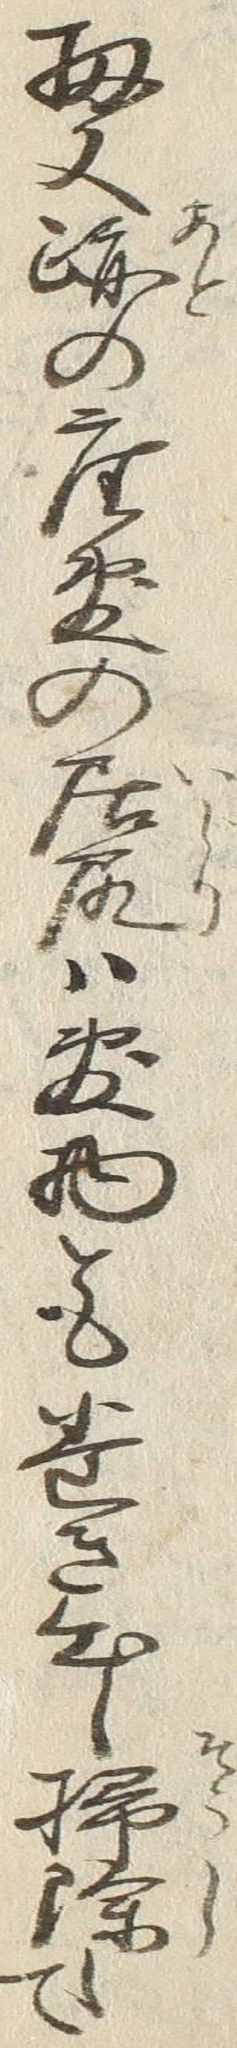扨又跡の座敷の居尻は敷物とも巻き出し掃除して
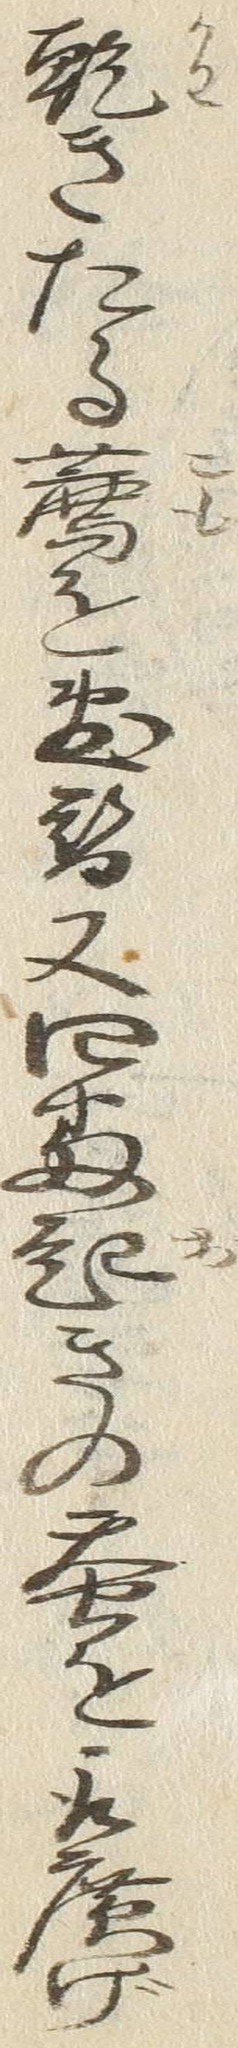乾きたる薦を敷替又四番起きの蚕を取廣げ
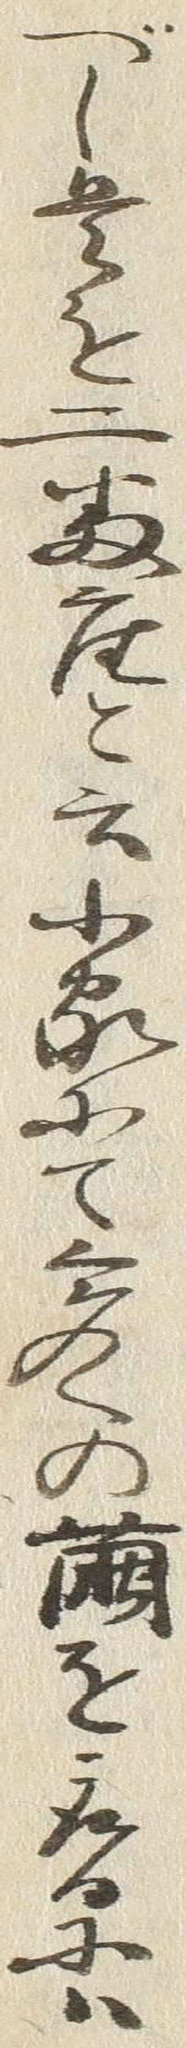べし是を二番座と云小家尓て多くの繭を取る尓は
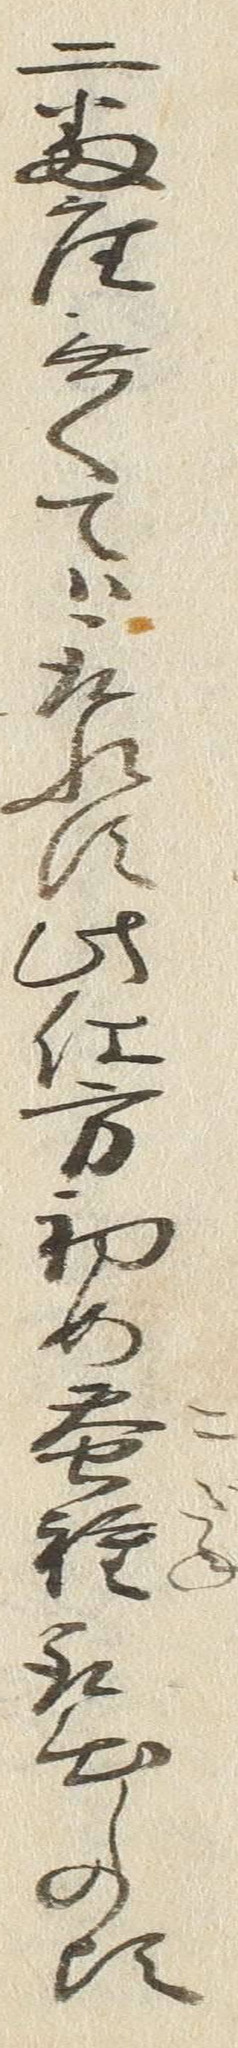二番座無くては取れ須此仕方初め蚕種取出しの頃
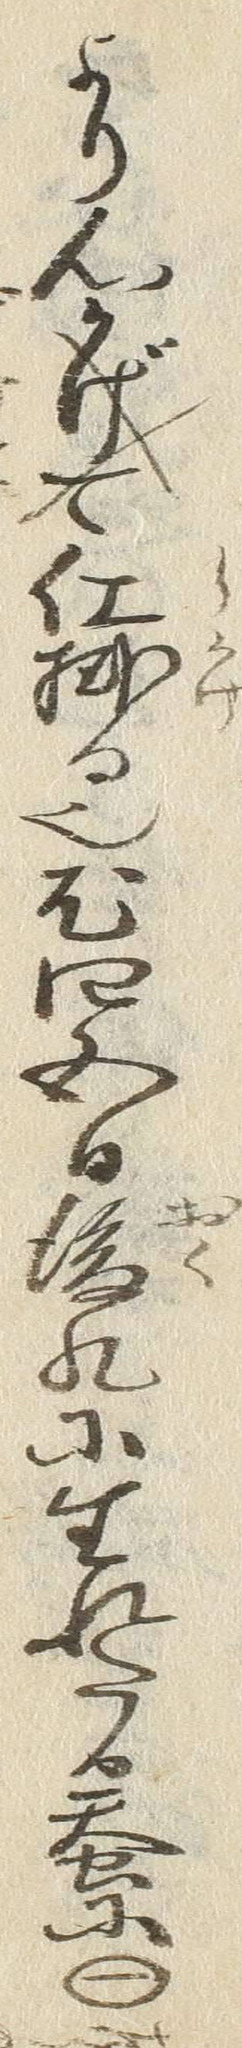より心がけて仕掛る也尤四五日後れ尓生れたる蚕尓
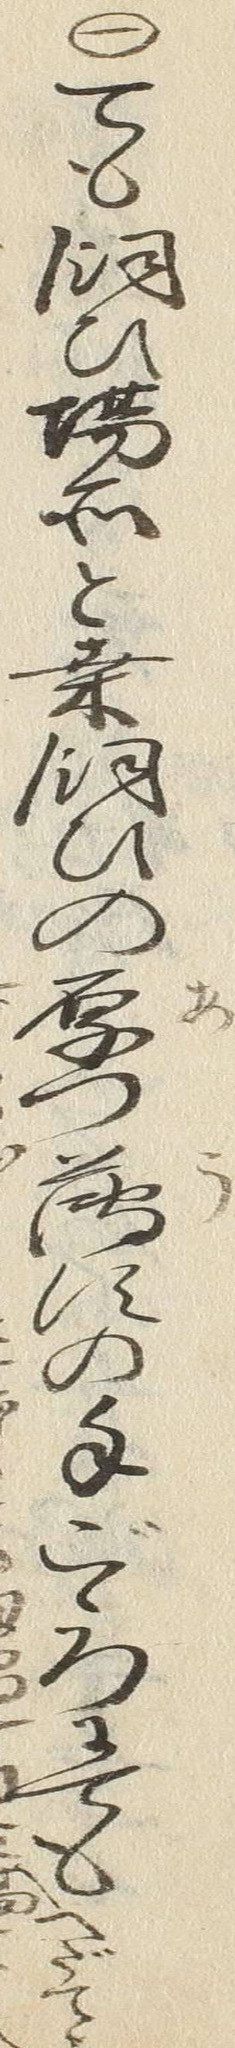ても飼ひ場所と桑飼ひの厚つ薄須の手ごゝろ尓ても
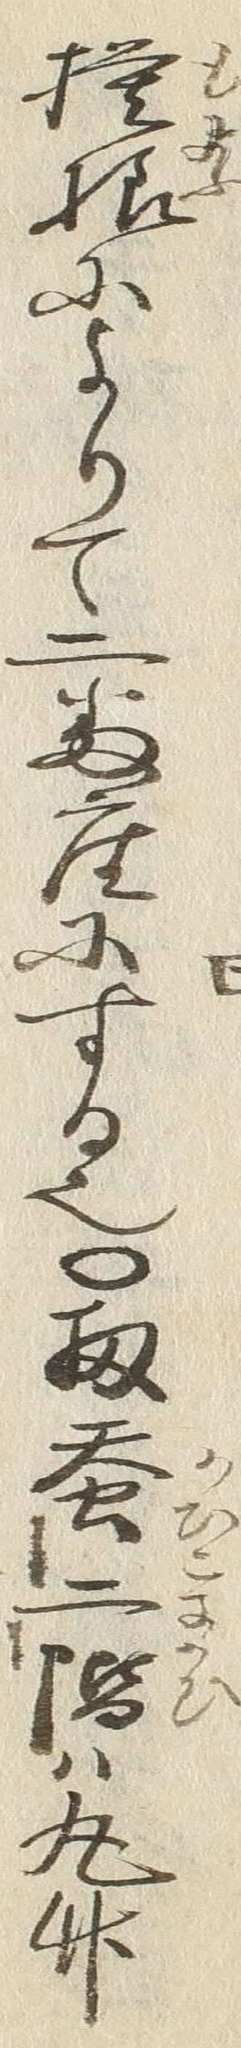模様尓よりて二番座尓する也〇扨蚕二階は丸竹
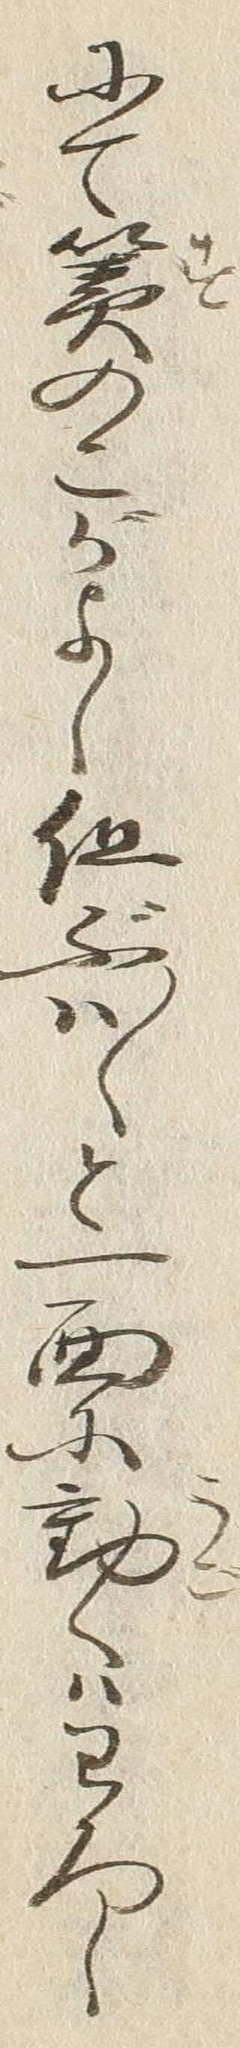尓て簀のこがよし但ぶは〳〵と一面尓動くはわろし
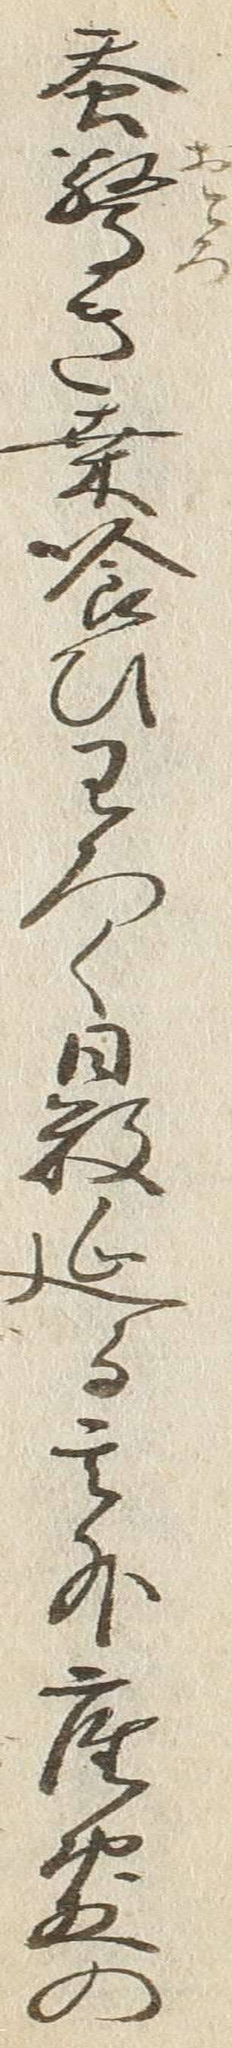蚕驚き桑喰ひわろく日数延る其外座敷の
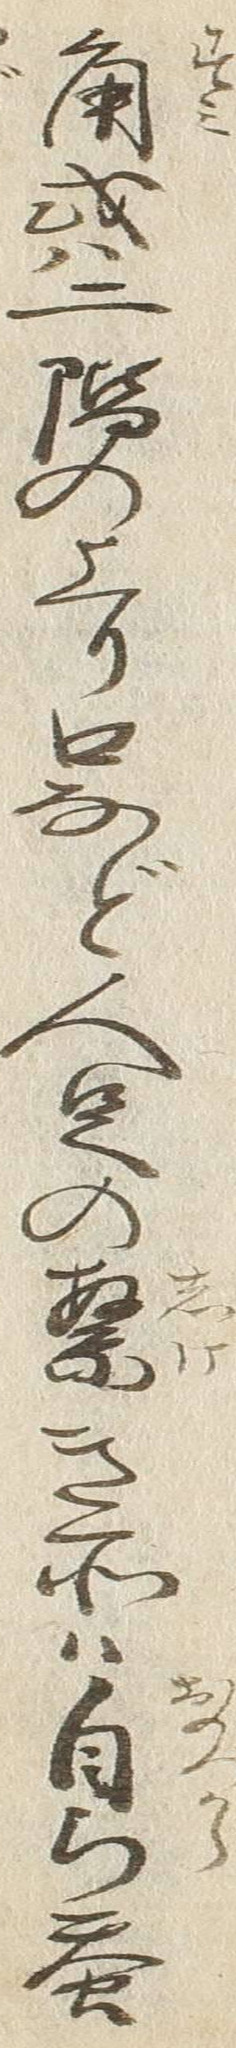角或は二階の上り口など人足の繁き所は自ら蚕
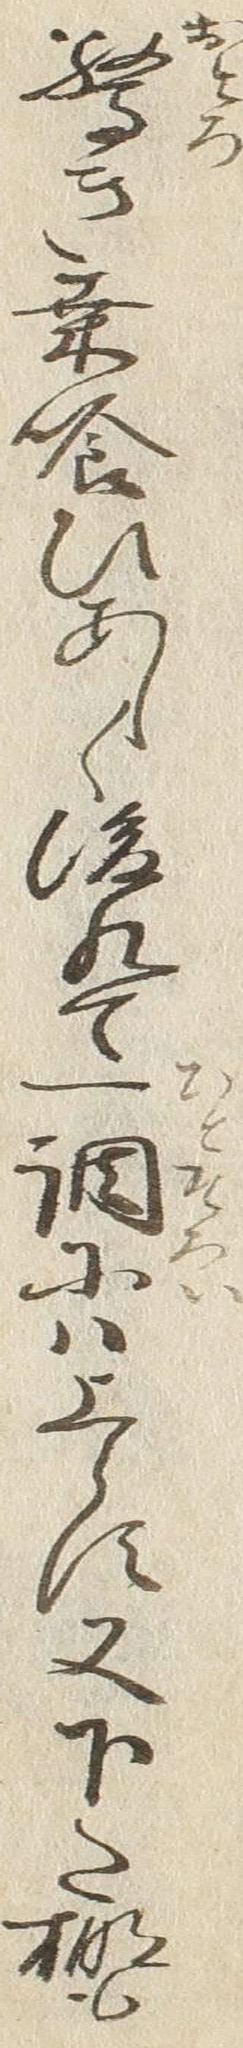驚き桑喰ひあしく後れて一調尓は上ら須又下た棚も
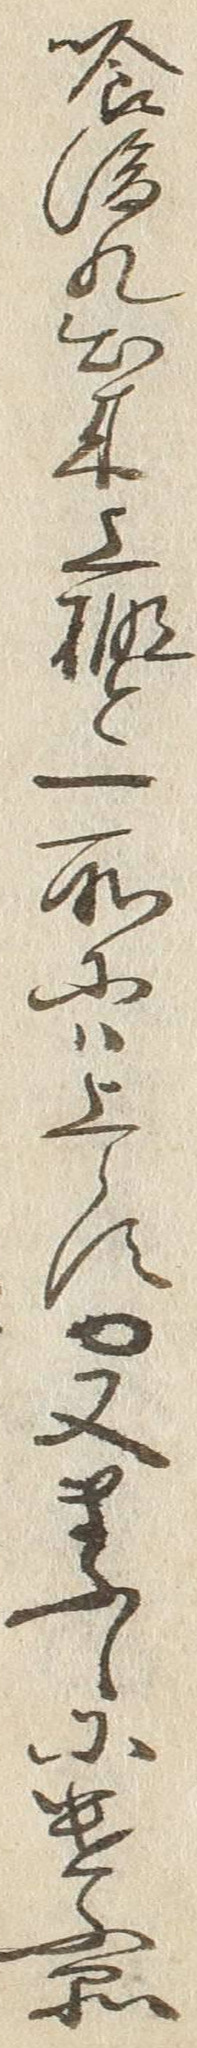喰後れ出来上棚と一所尓は上ら須〇又まふし尓遣ふ品
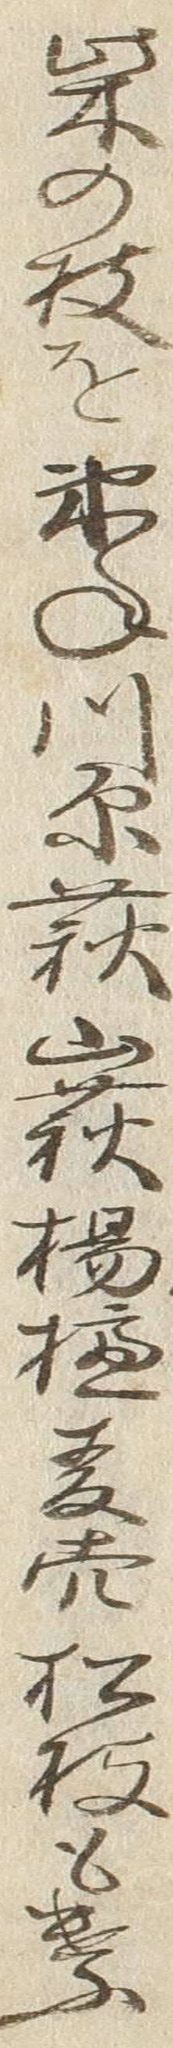柴の枝を束年川原萩山萩楊櫨麦空松枚も遣ふ
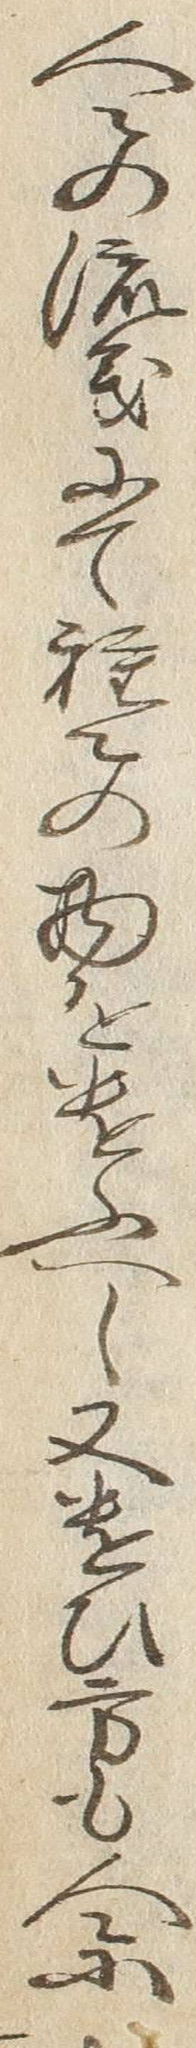人々の流義尓て種々の物を遣ふへし又遣るひ方も人々尓

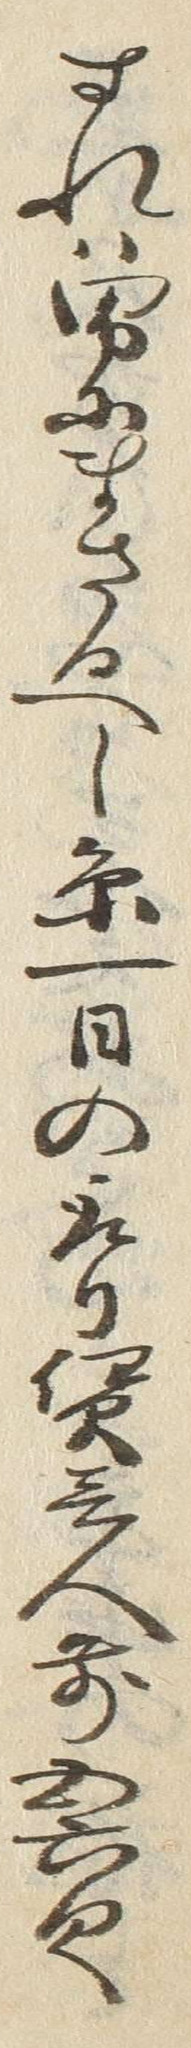すれは男尓まさるへし糸一日の取り賃壱人前五六匁
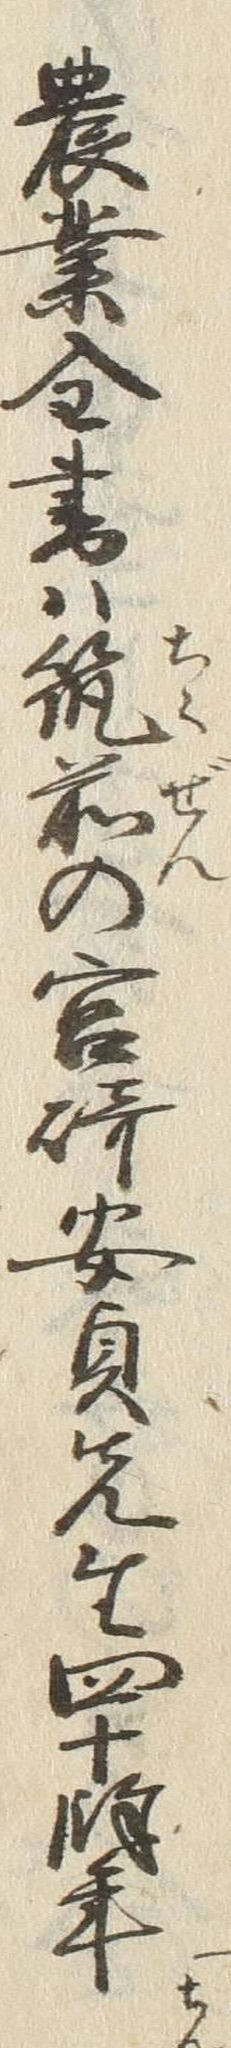農業全書は筑前の宮崎安貞先生四十餘年
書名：養蠶實驗録後編
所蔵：東京大学農学生命科学図書館 国文学研究資料館
